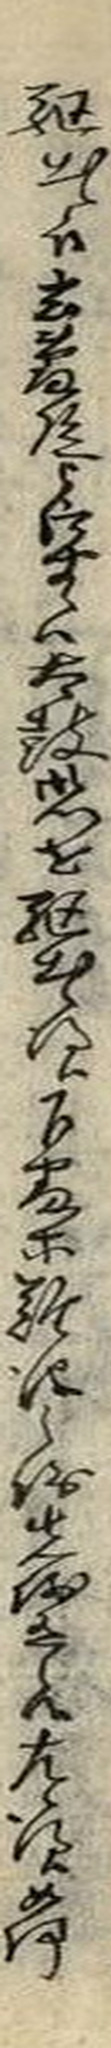駆出候に付玄蕃殿被仰聞候は太鼓御門を駆出候得は下番等難儀之儀先例有之候左候得は如何
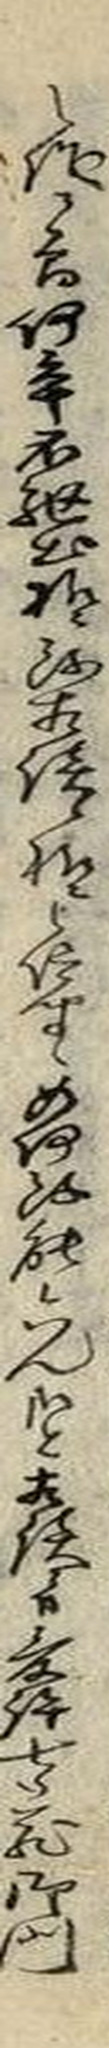之儀に候間何卒不駆出様に致相談候様に被仰聞候如何致能候はん哉と相談に付爰元七ツ蔵御門
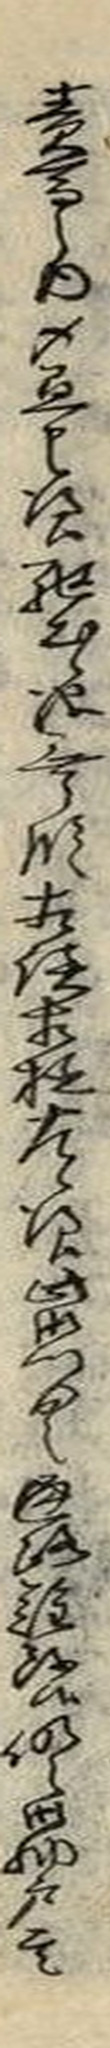責馬之内〆置申候候得は駆出候儀無之段相談相極左候得は此御門ゟ之通路難致候仍之御納戸其
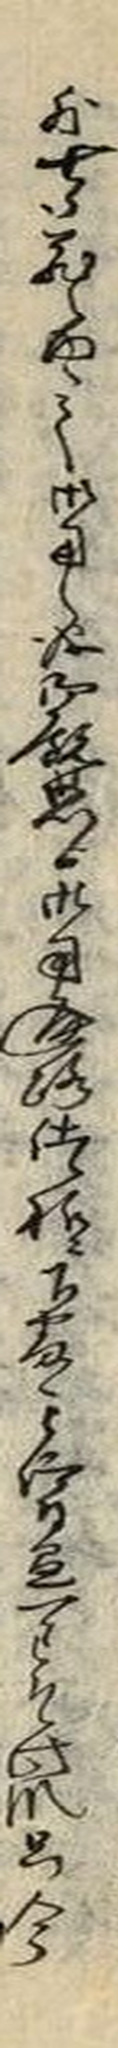外七ツ蔵之内へ之御用之儀御厩御門ゟ御用通路仕候様に下番へ被仰付置可被下候此段只今
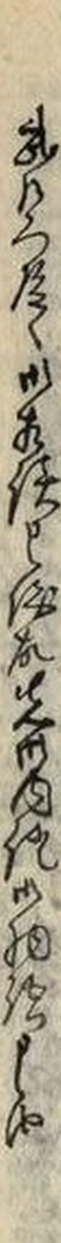武左衛門殿へ御相談申候儀故先御内証御物語申候由
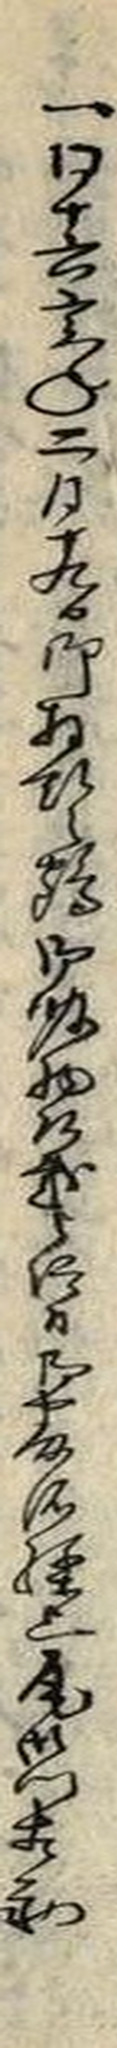一同十六亥年二月十九日御拝領之鶴御吸物頂戴被仰付御番所繰上瓦御門相勤
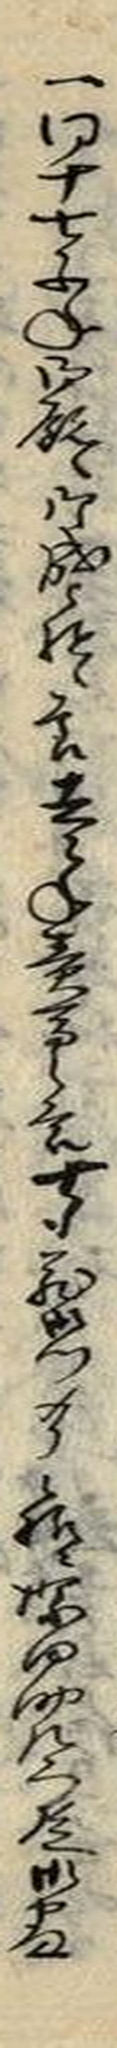一同十七子年御厩へ御成被遊候節去々年責馬之節七ツ蔵御門〆り候様に塚田助左衛門殿御番
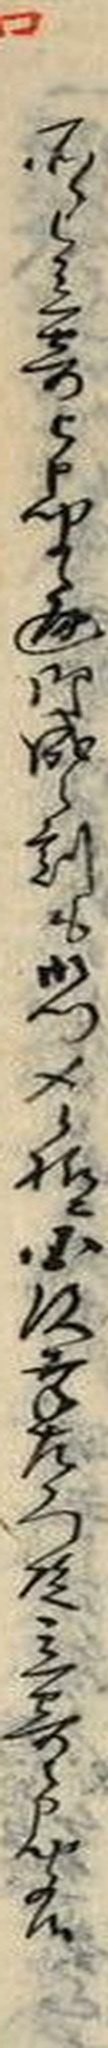所へ被立寄被申聞候通御成候刻も御門〆候様に小沢幸左衛門殿立寄被申聞候

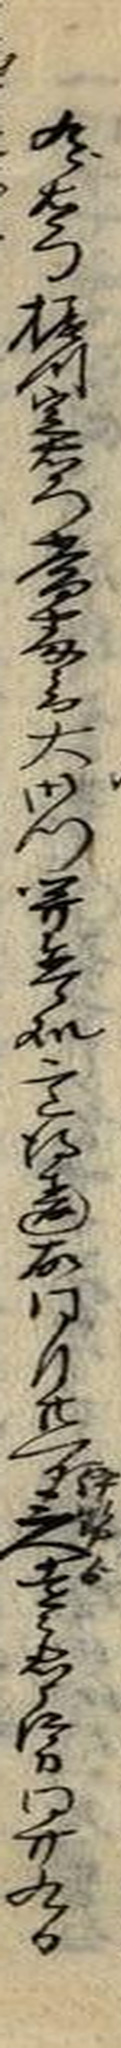九郎右衛門梶川定右衛門常番に而大御門開置候処意得違故同月廿一日伊勢ゟ三人遠慮被仰付同廿九日
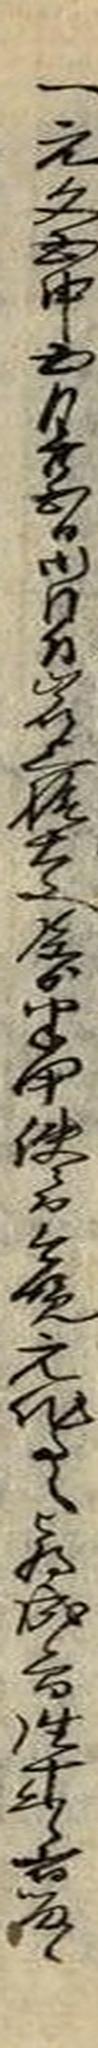一元文五申五月廿五日御目付岩上梶太夫殿ゟ半甲使に而今晩元作事へ被為成候間往来之者留候
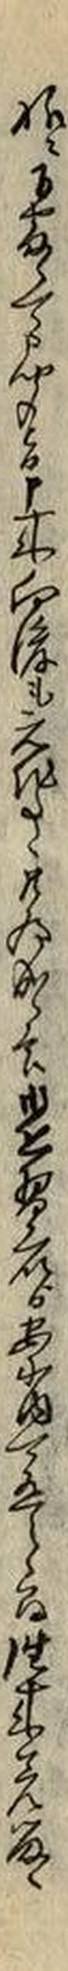様に下番へ可申聞旨申来向後も元作事へ被為成候節御近習衆ゟ案内可有之候間往来差留候
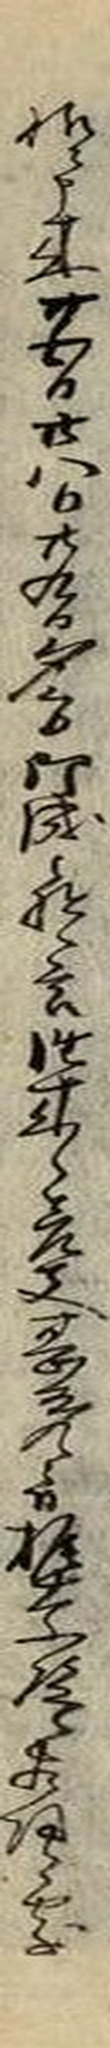様に申来廿五日廿八日廿九日夕方御成被遊候節往来之差支甚多候ニ付梶太夫殿へ相伺候処
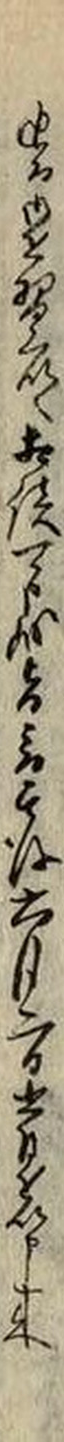追而御近習衆へ相談可申越旨に而其後六月二日書付を以申来
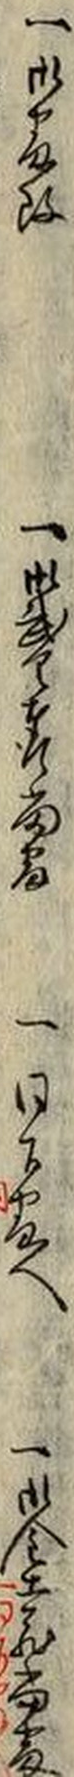一御番改一御武具奉行当番一同下番人一御金土蔵当番
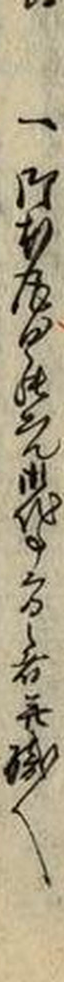一御本丸へ罷出候御作事方之者并職人
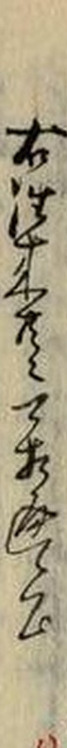右往来共に可相通候以上
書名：御門御櫓之部
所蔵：福井県文書館 Fukui Prefectural Archives
